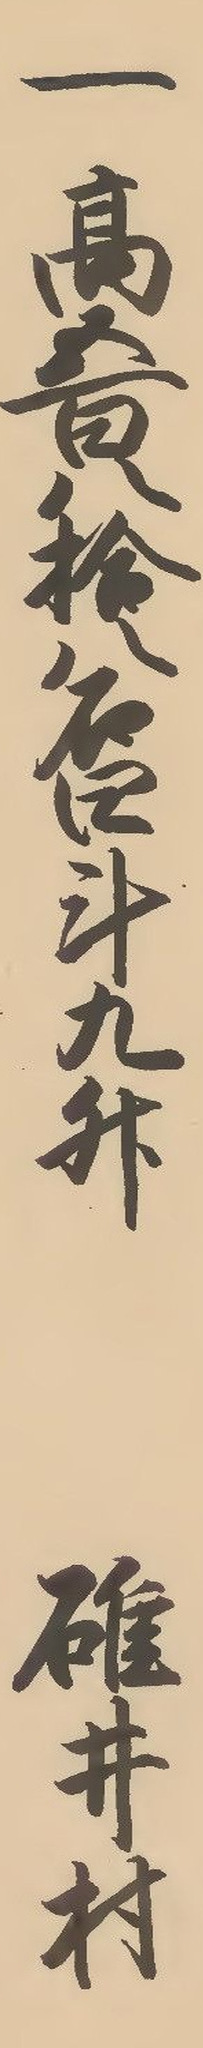一高五百八拾八石四斗九升碓井村
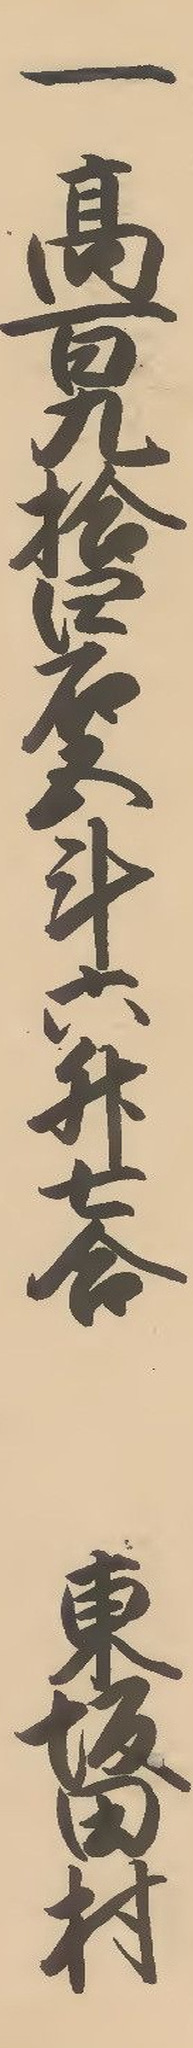一高百九拾四石五斗六升七合東坂田村
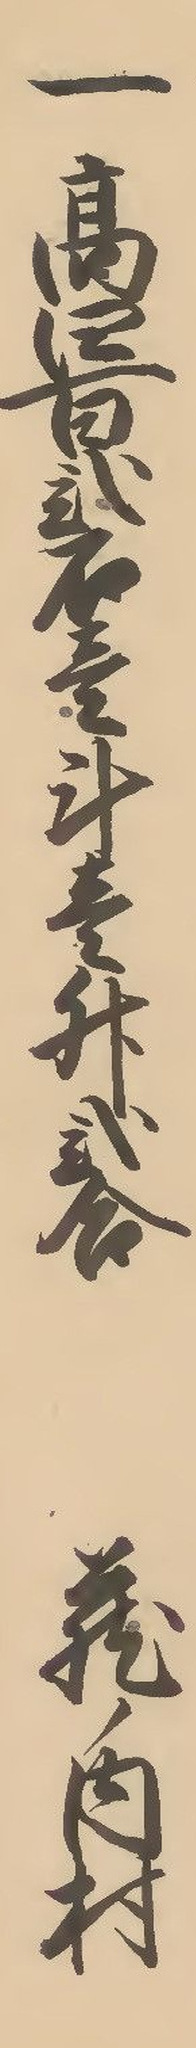一高四百弐石壱斗壱升弐合蔵ノ内村

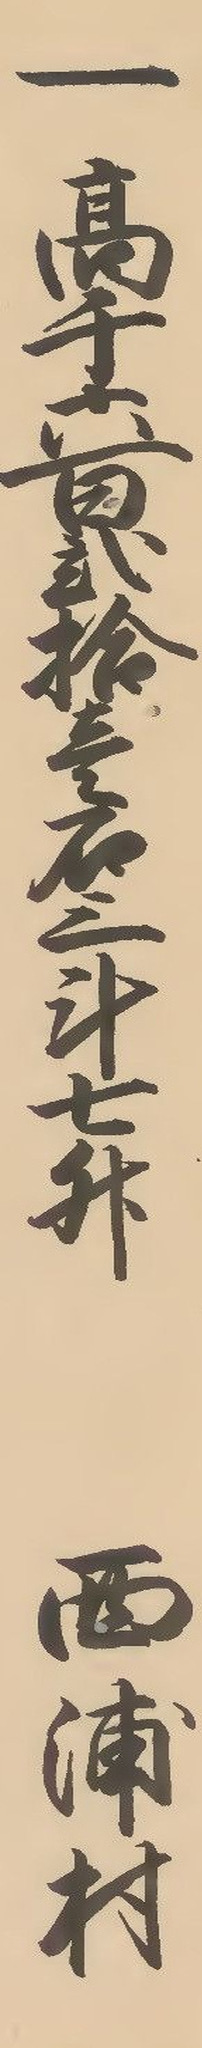一高千六百弐拾壱石三斗七升西浦村
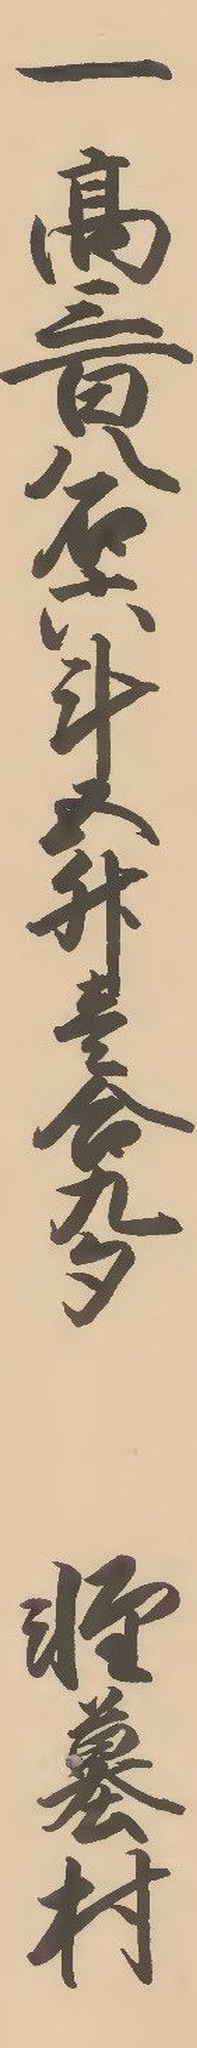一高三百八石六斗五升壱合九勺軽墓村
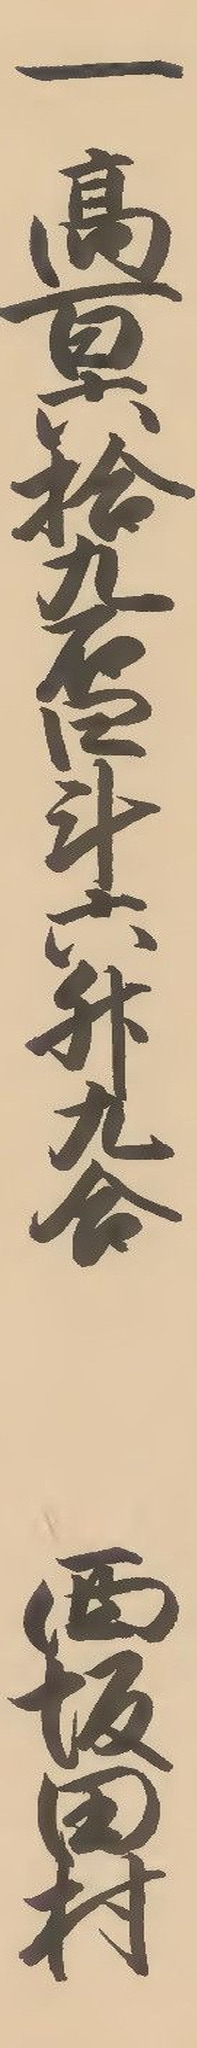一高百六拾九石四斗六升九合西坂田村
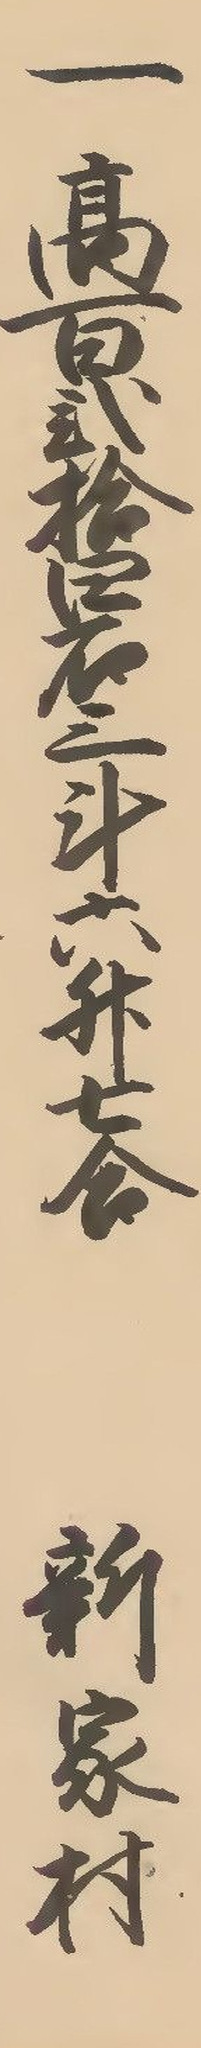一高百弐拾四石三斗六升七合新家村
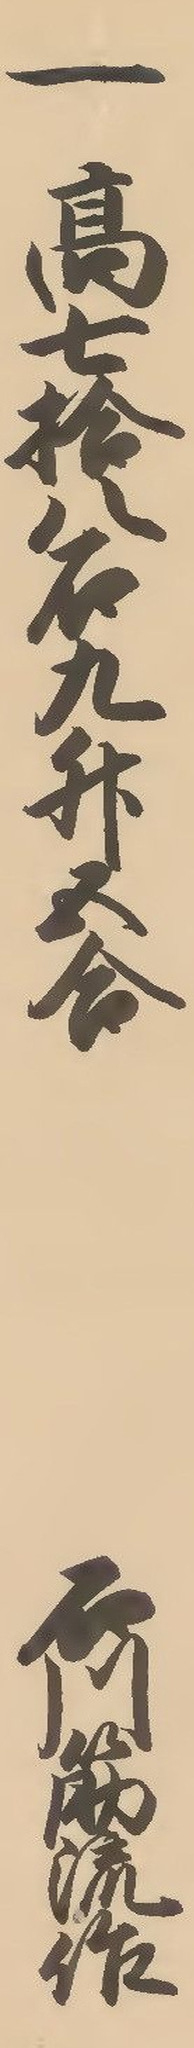一高七拾八石九升五合石川筋流作
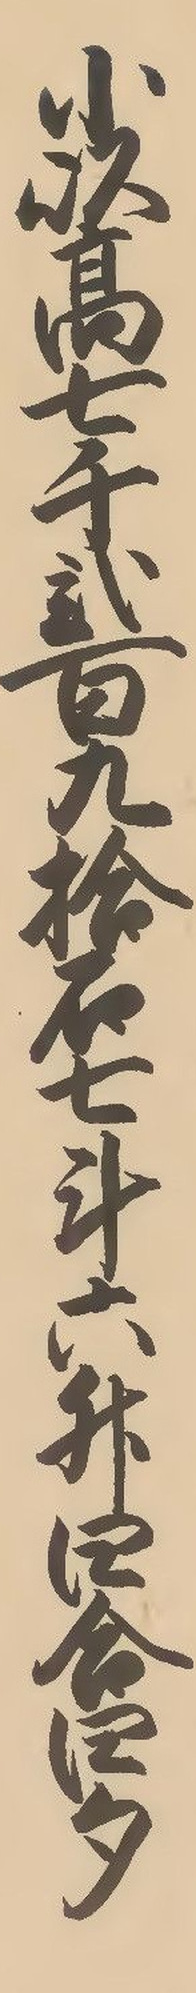小以高七千弐百九拾石七斗六升四合四勺

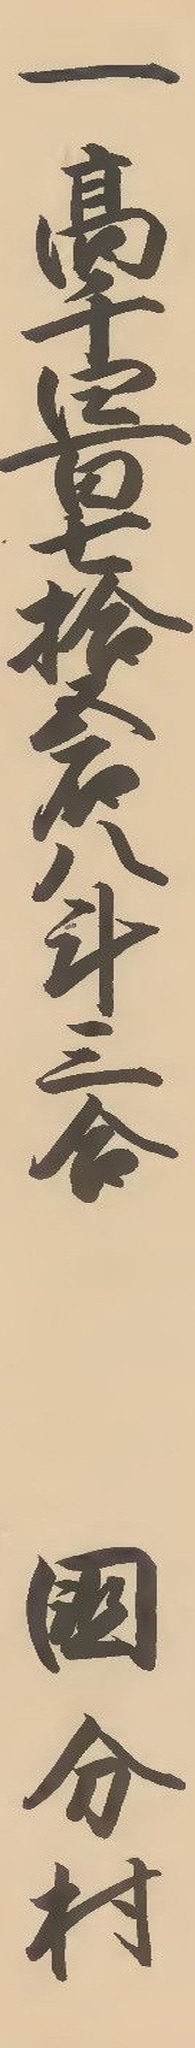一高千四百七拾五石八斗三合国分村
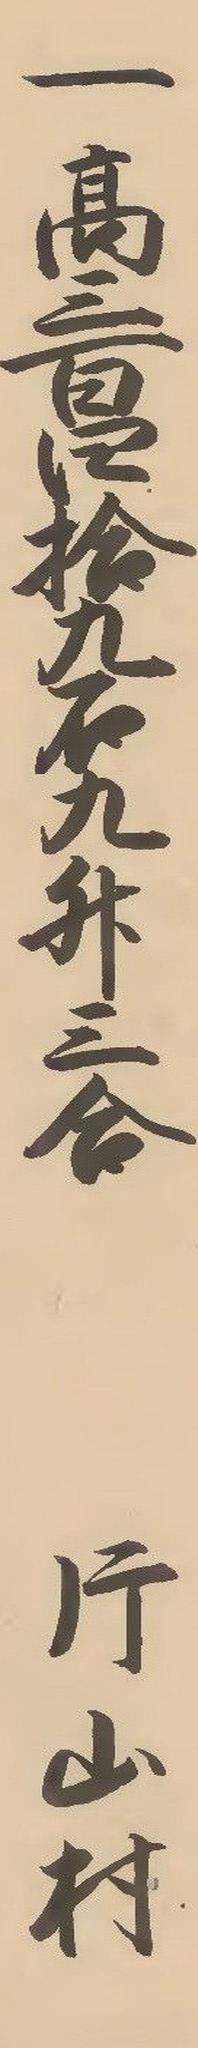一高三百四拾九石九升三合片山村
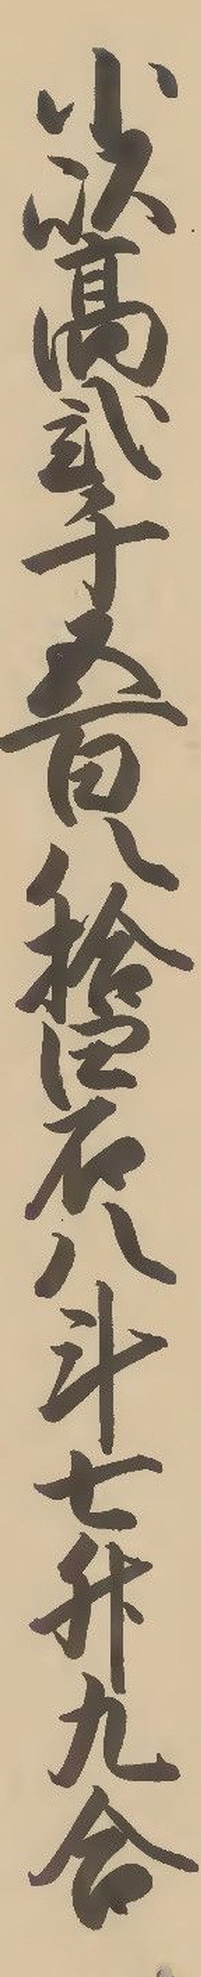小以高弐千五百八拾四石八斗七升九合

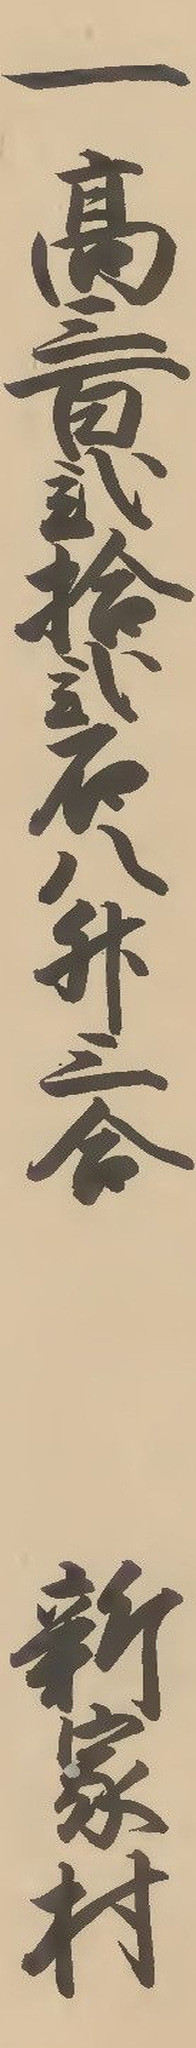一高三百弐拾弐石八升三合新家村
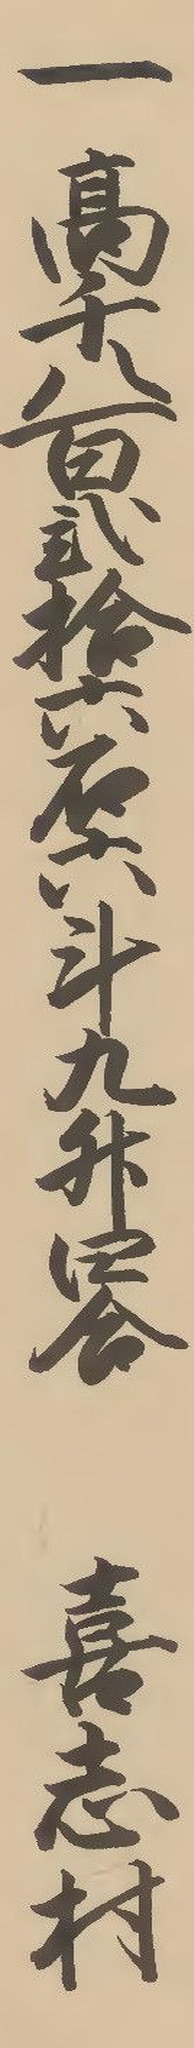一高千八百弐拾六石六斗九升四合喜志村
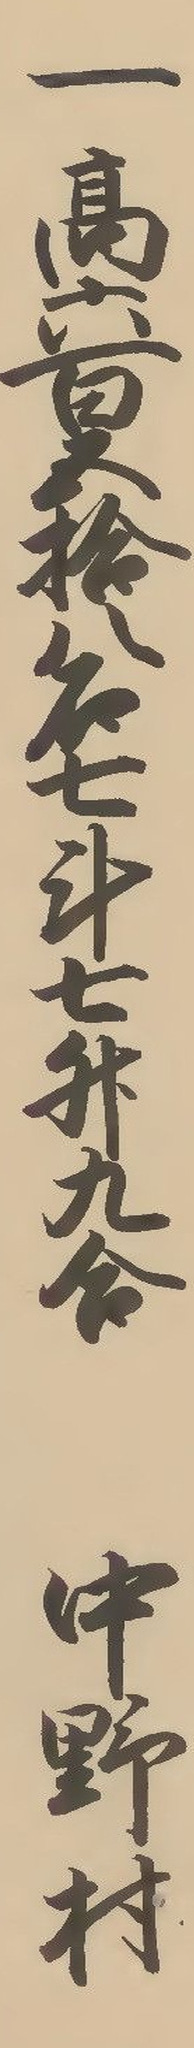一高六百五拾八石七斗七升九合中野村
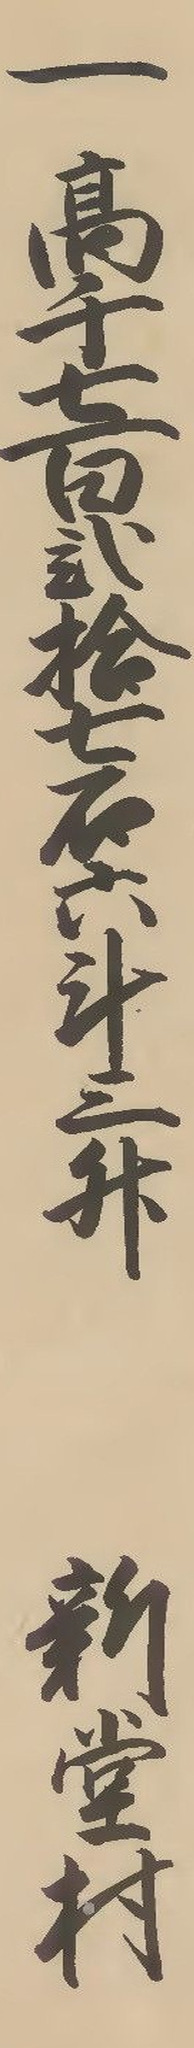一高千七百弐拾七石六斗三升新堂村
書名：河内国郷帳
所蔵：国立公文書館 National Archives of Japan
